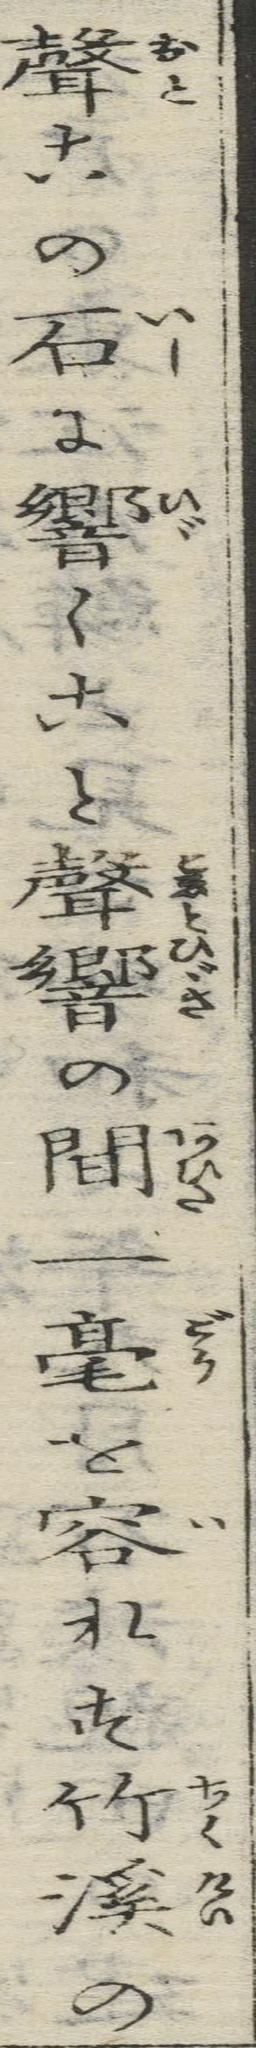声この石に響くこと声響の間一毫を容れす竹溪の
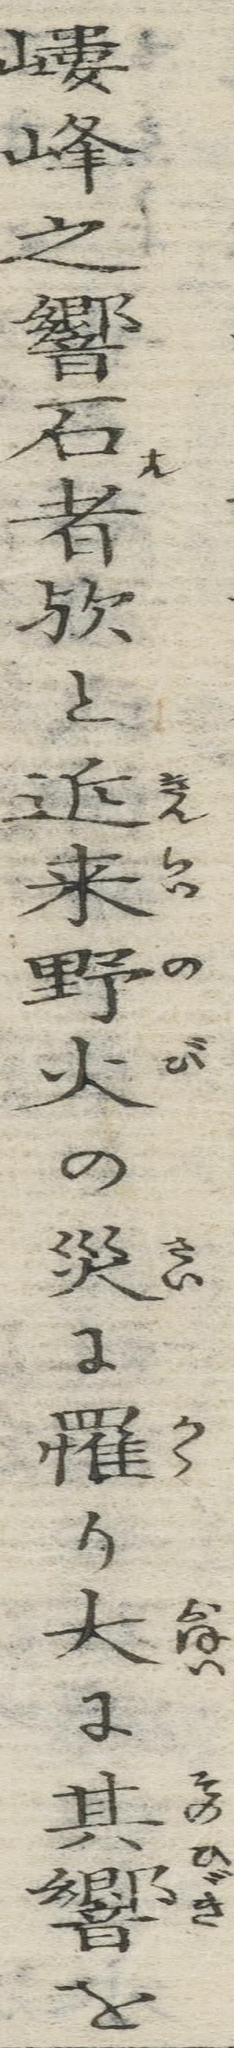嶁峰之響石者欤と近来野火の災に罹り大に其響を
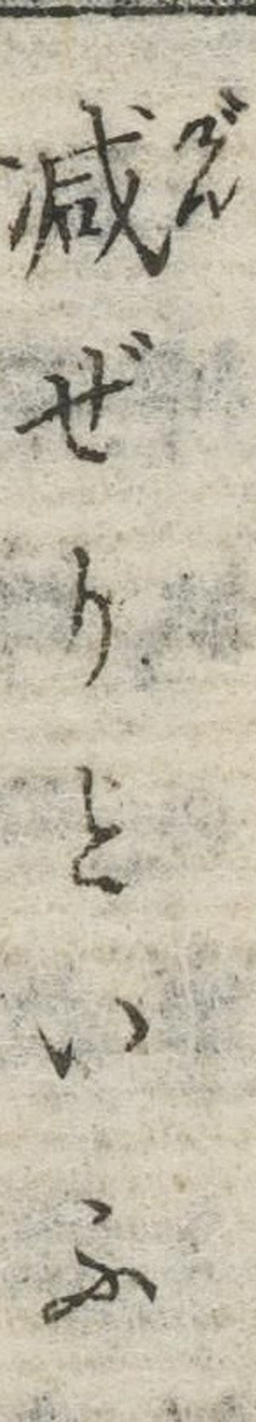減ぜりといふ
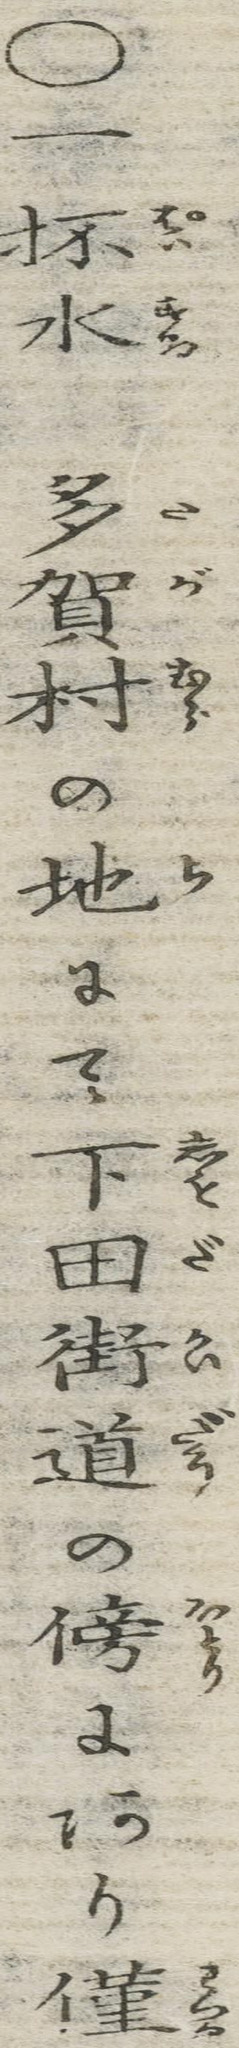○一杯水多賀村の地にて下田街道の傍にあり僅
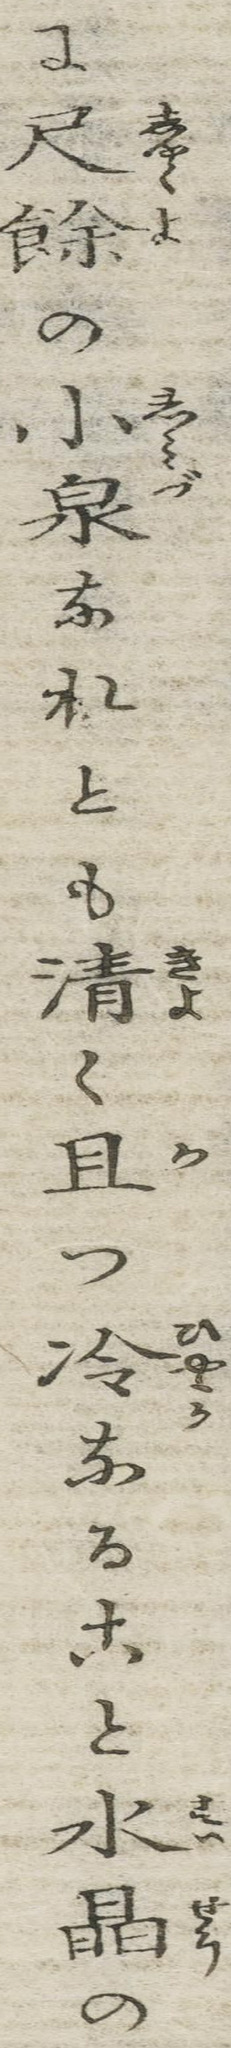に尺余の小泉なれとも清く且つ冷なること水晶の
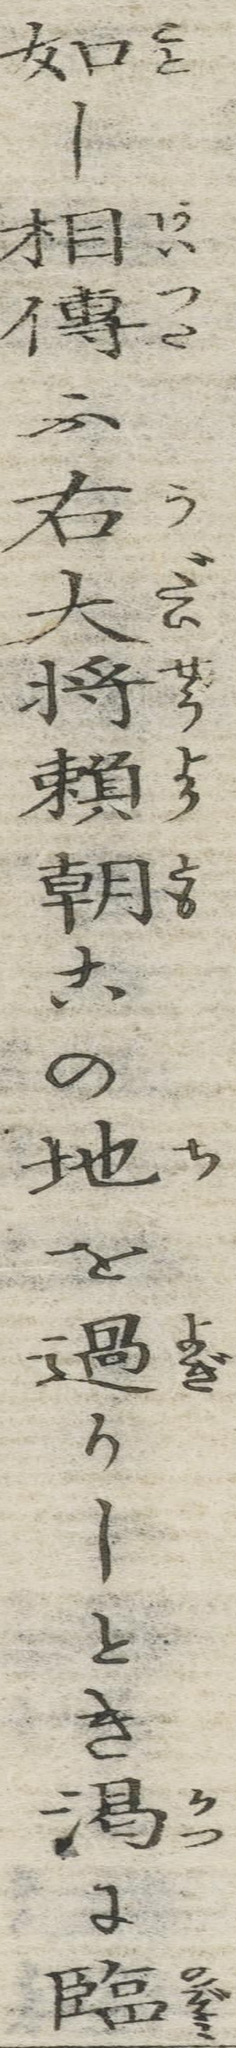如し相伝ふ右大将頼朝この地を過りしとき渇に臨
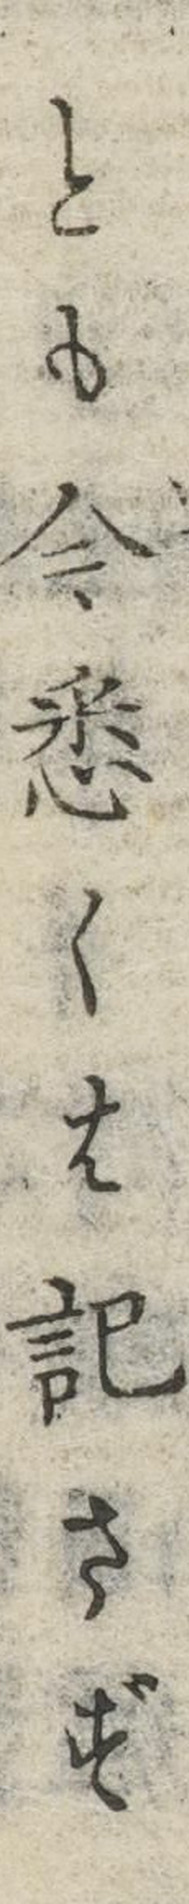とも今悉くは記さず

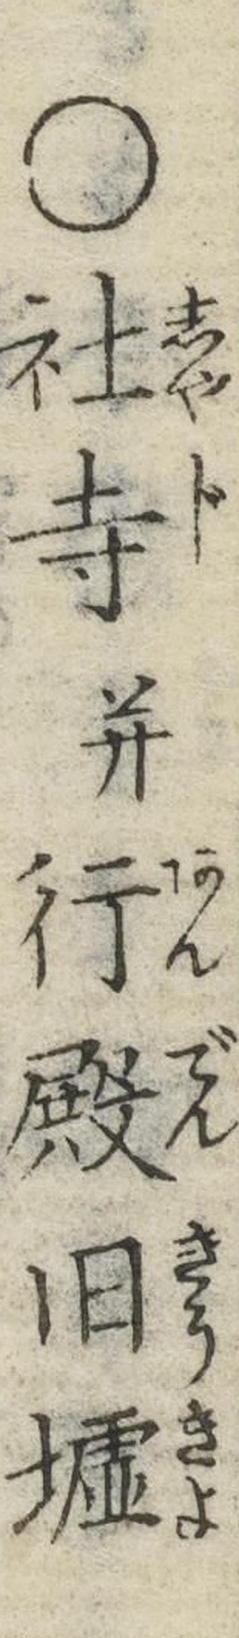○社寺并行殿旧墟
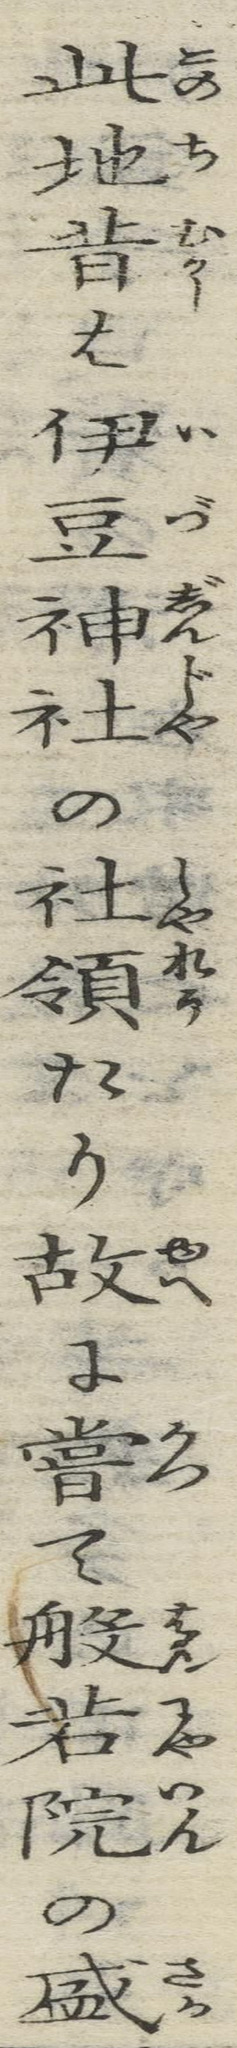此地昔は伊豆神社の社領たり故に嘗て般若院の威
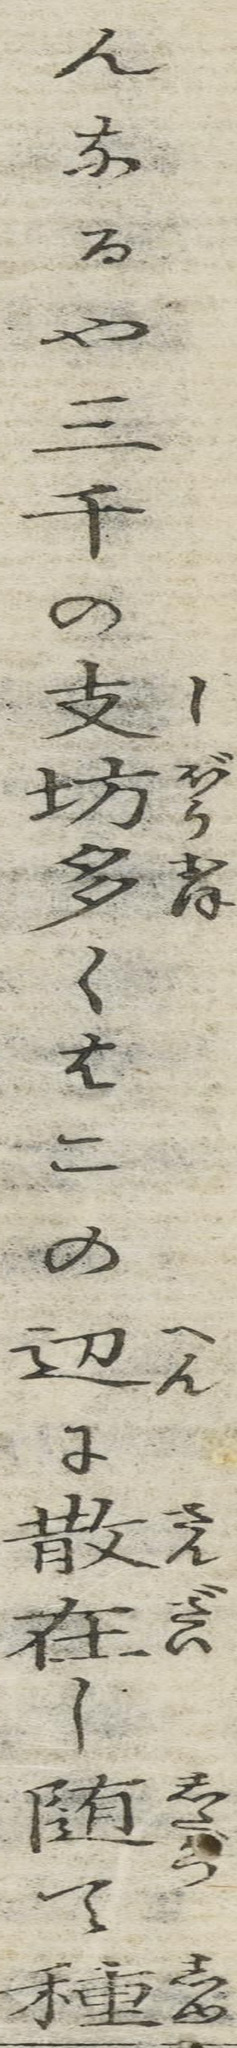んなるや三千の支坊多くはこの辺に散在し随て種
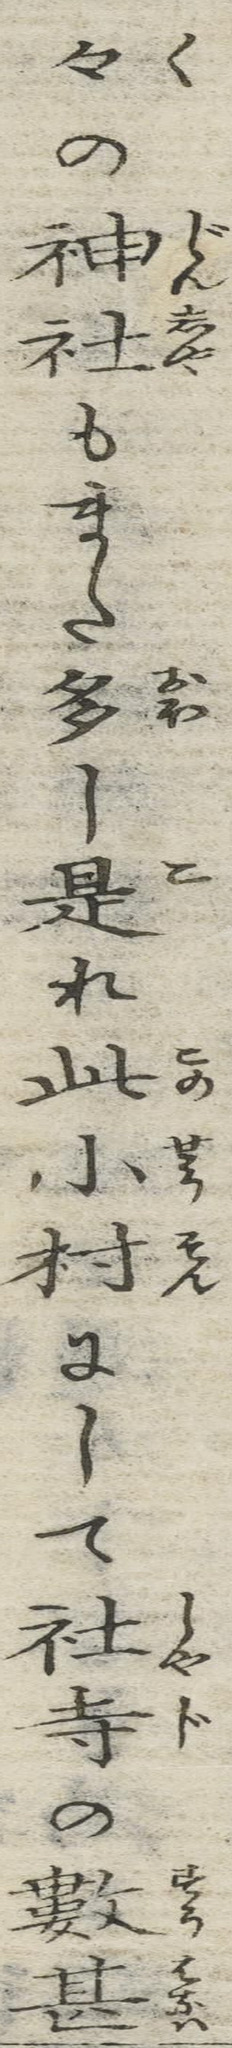々の神社もまた多し是れ此小村にして社寺の数甚
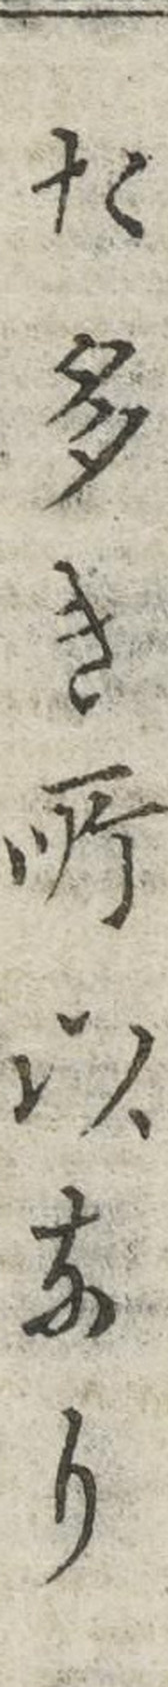た多き所以なり
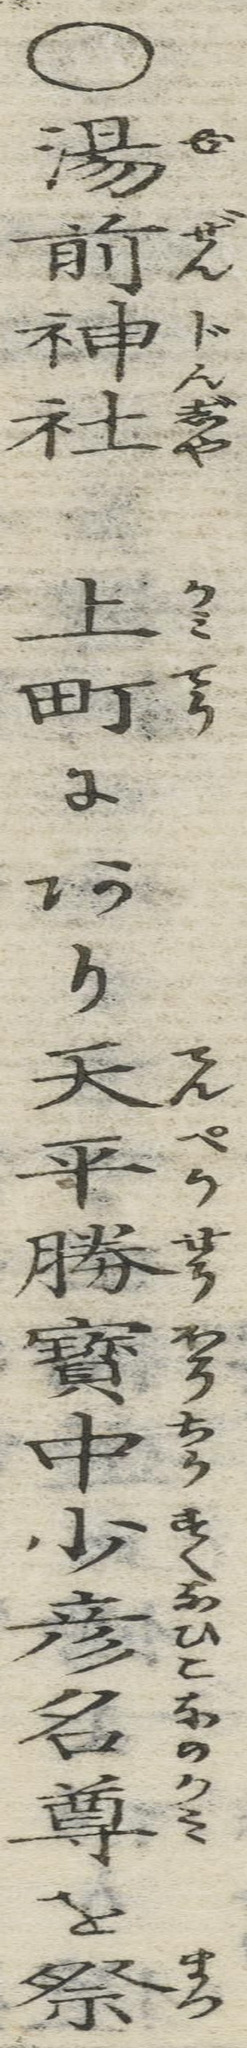○湯前神社上町にあり天平勝宝中少彦名尊を祭
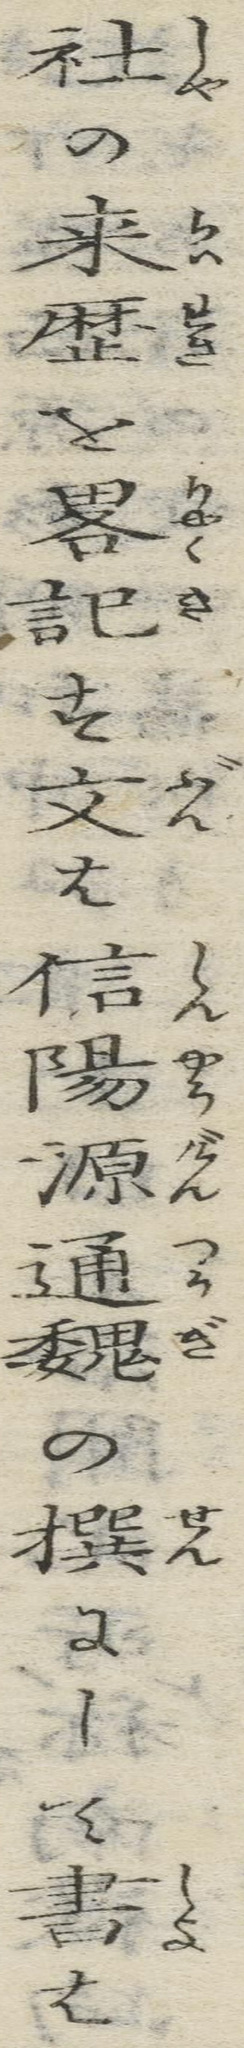社の来歴を略記す文は信陽源通魏の撰にして書は
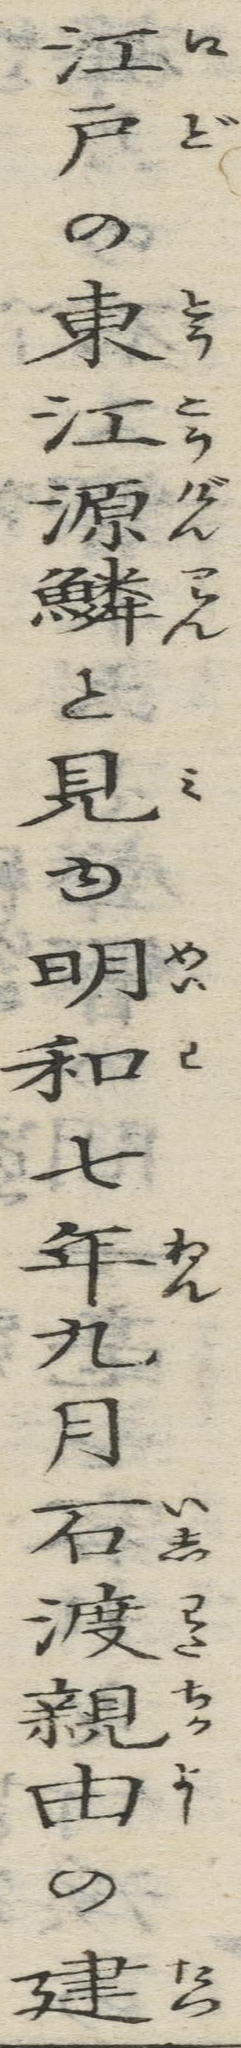江戸の東江源鱗と見ゆ明和七年九月石渡親由の建
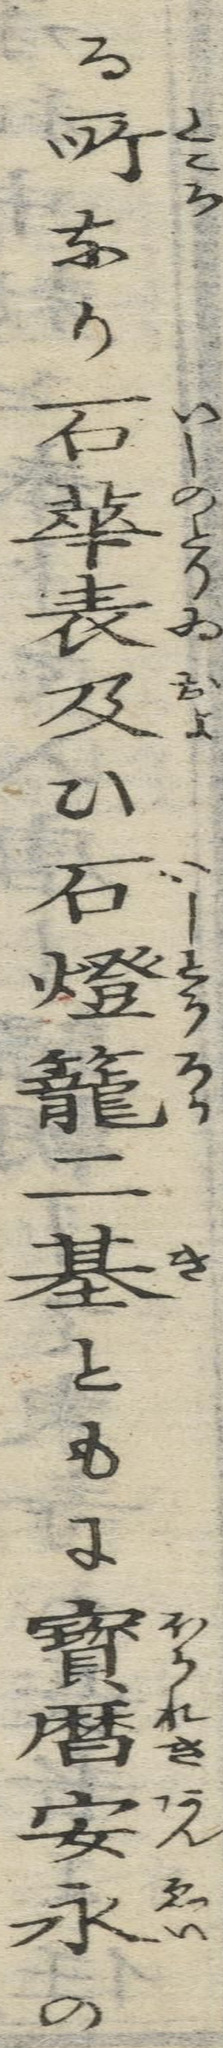る所なり石華表及ひ石燈籠二基ともに宝暦安永の
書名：豆州熱海誌　完
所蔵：東京大学地震研究所図書室 Earthquake Research Institute Library, The University of Tokyo, JAPAN
